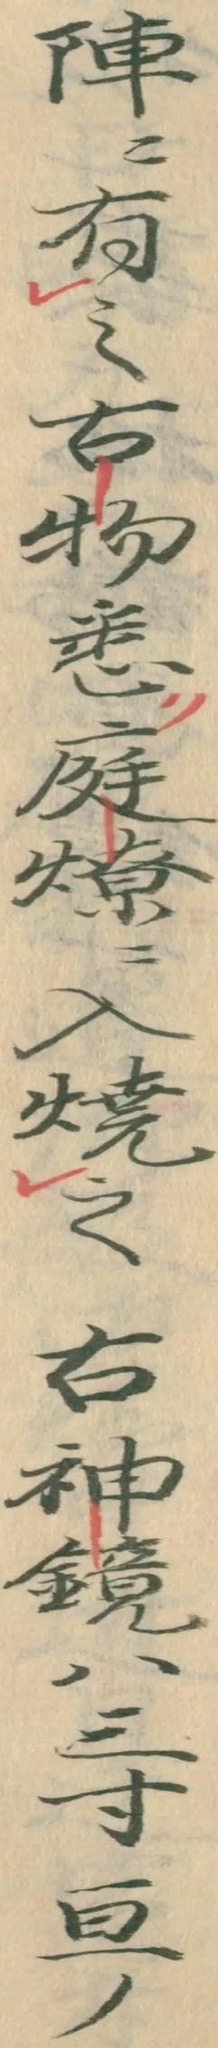陣ニ有之古-物悉庭-燎ニ入焼之古神-鏡ハ三寸亘ノ

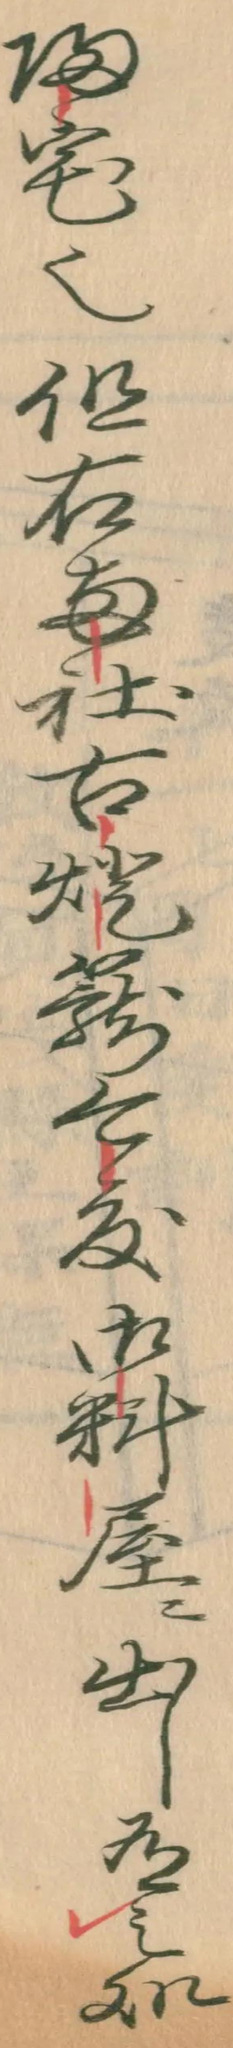帰-宅也但右両-社古-燈-籠今-度御-料_屋ニ出し有之処
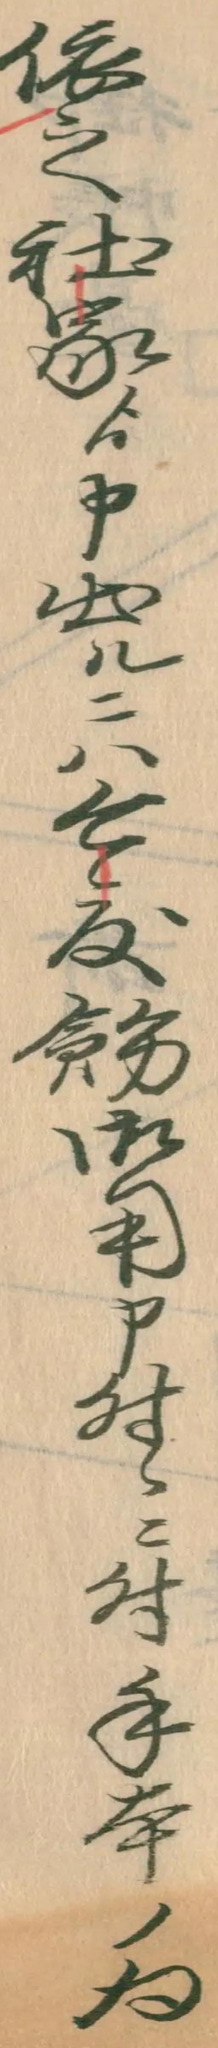依之社-家ゟ申出ルニハ今-度飾御用申付候ニ付手本ノ為
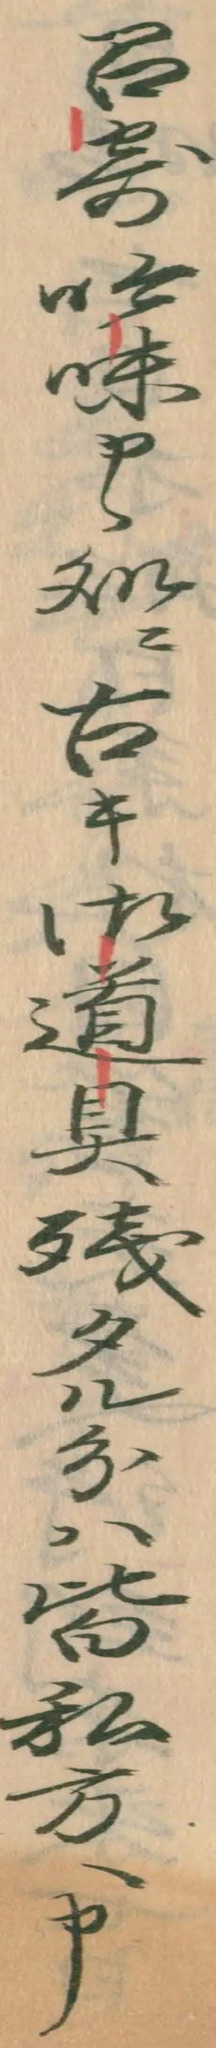召_寄吟-味申候処ニ古キ御-道-具残タル分ハ皆私方へ申
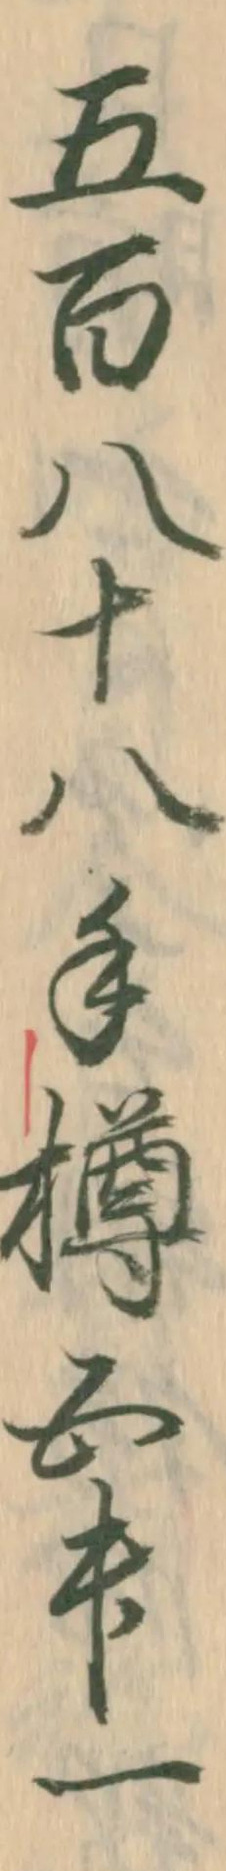五百八十八手_樽五升一
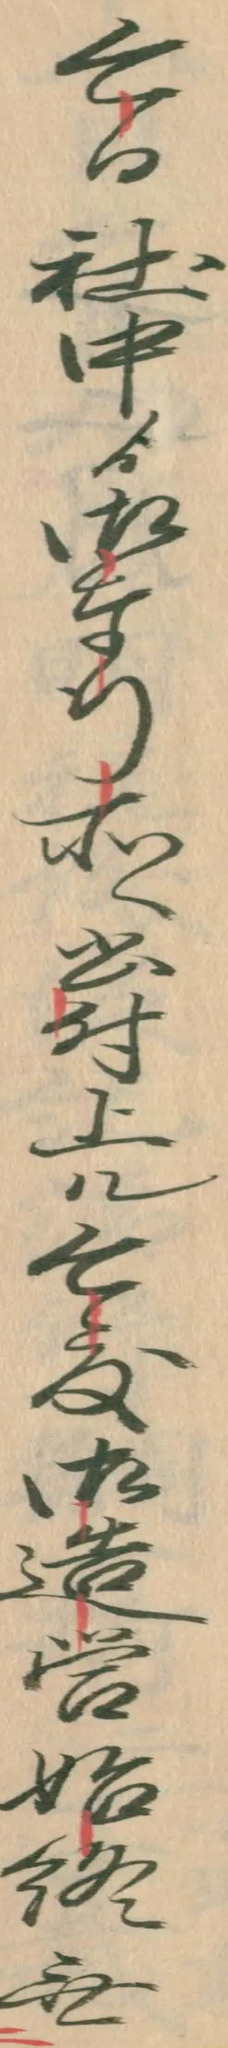今-日社中ゟ御-奉-行-所へ書_付上ル今-度御-造-営始-終無
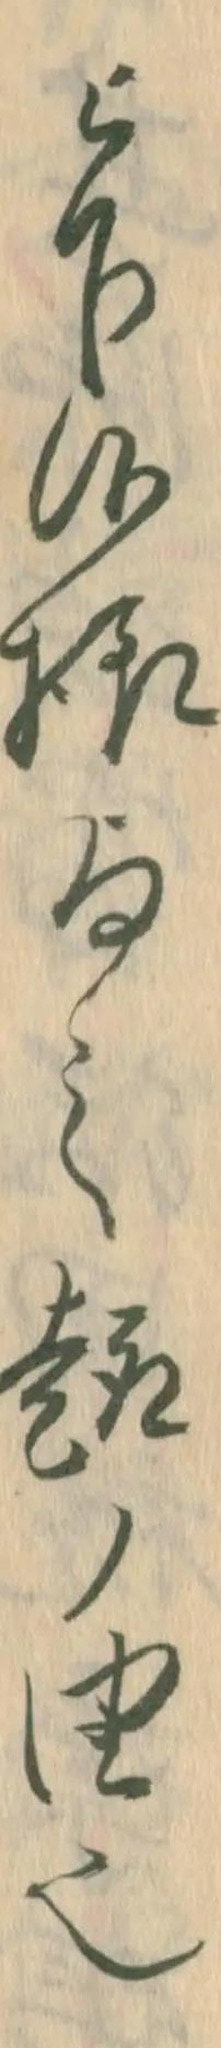被下候様旨之趣ノ由也
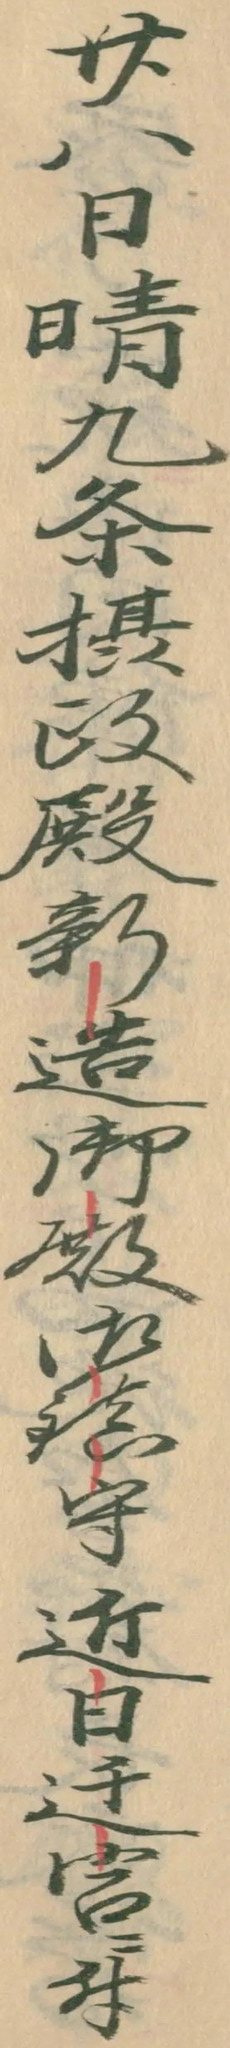廿八日晴九条摂政殿新-造御-殿御-鎮-守近-日迁-宮ニ付

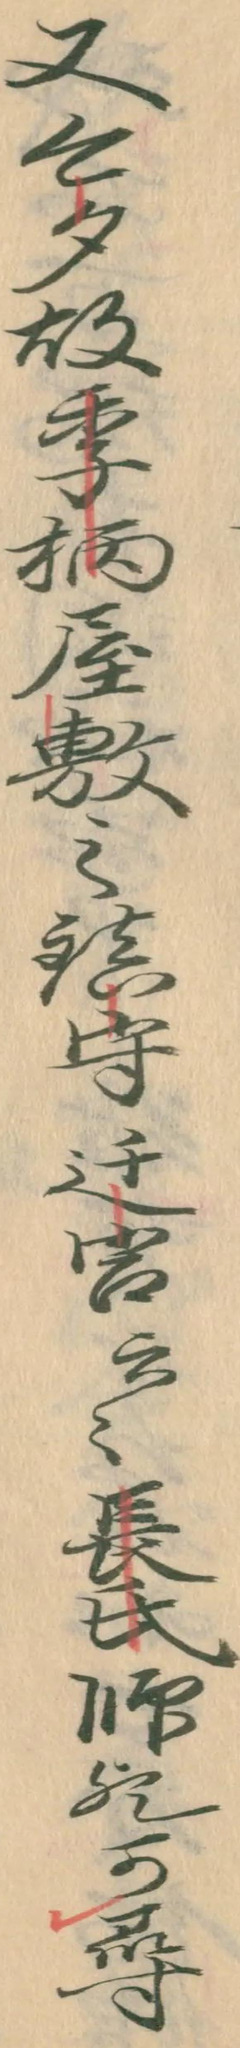又今-夕故季柄屋_敷之鎮-守迁-宮云々長氏師歟可尋
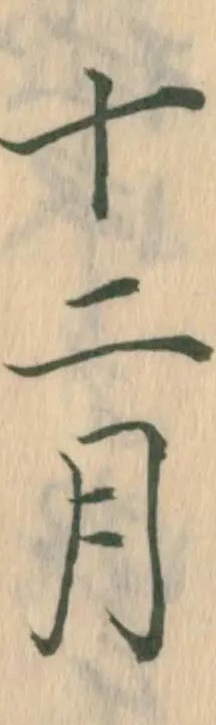十二月
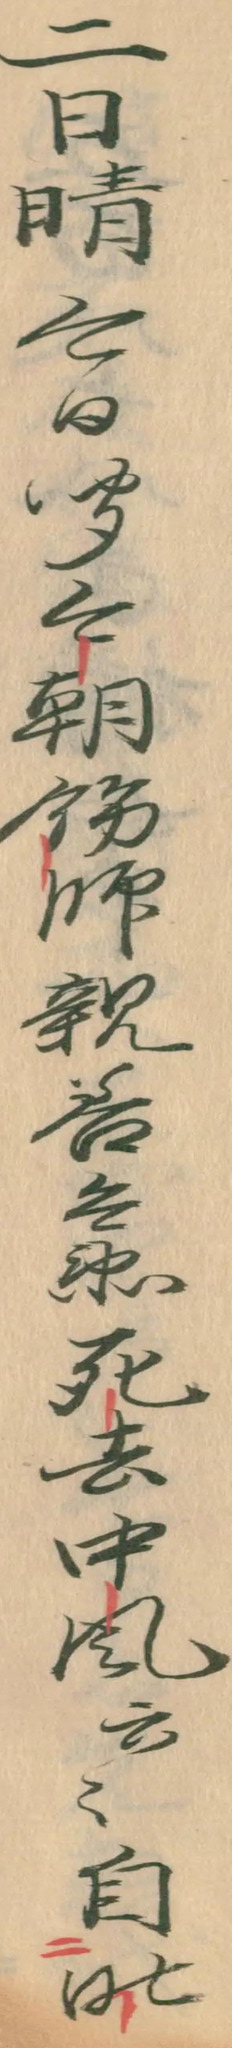二日晴今日聞今-朝飾_師親善兵衛死-去中-風云々自昨-
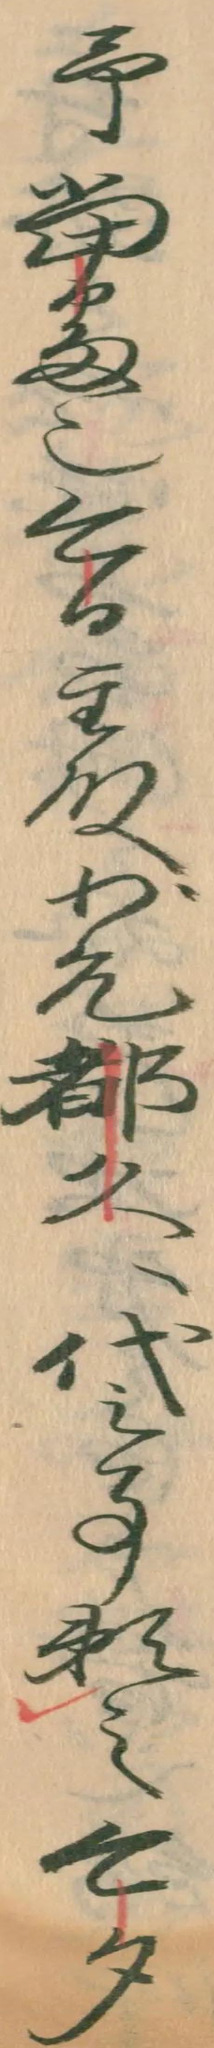予当-番也今-日主殿少允都久へ代之事頼之今-夕
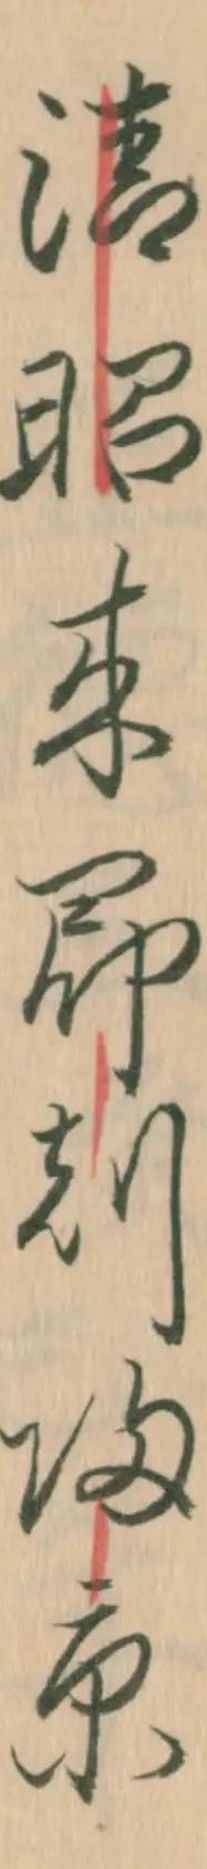清昭来即-刻帰-京
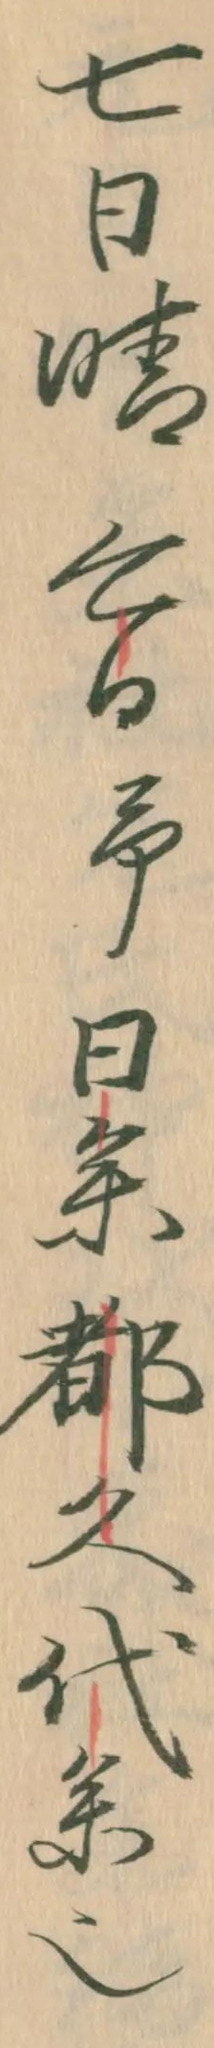七日晴今-日予日-参都久代-参也
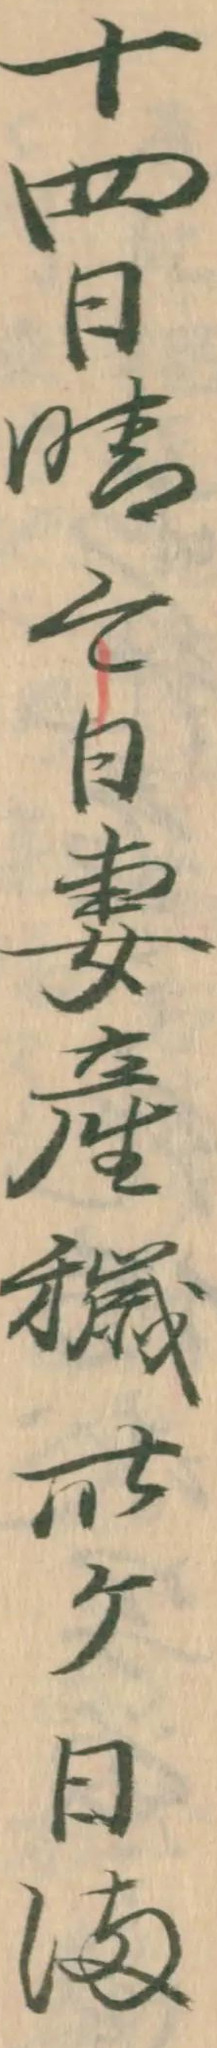十四日晴今-日妻産穢卅ケ日満
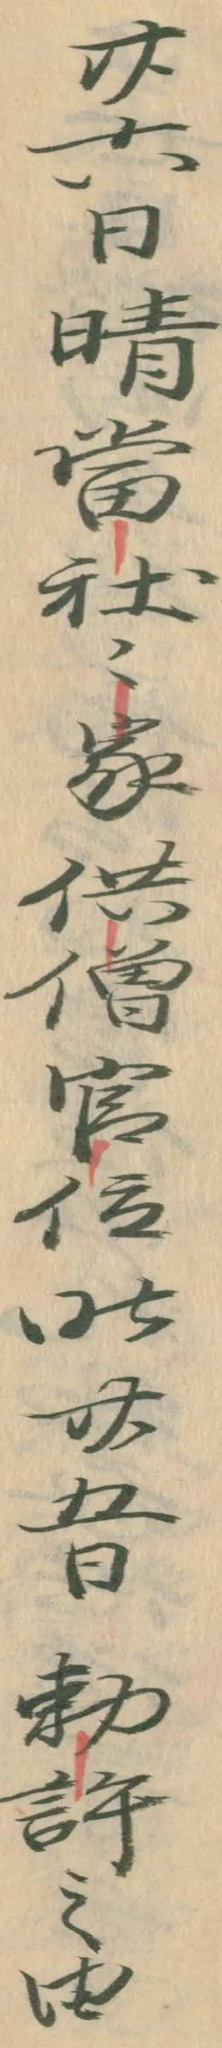廿六日晴当-社々-家供-僧官-位昨廿五日勅-許之由
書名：賀茂社記録. 第16冊
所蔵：国立国会図書館 National Diet Library, JAPAN
